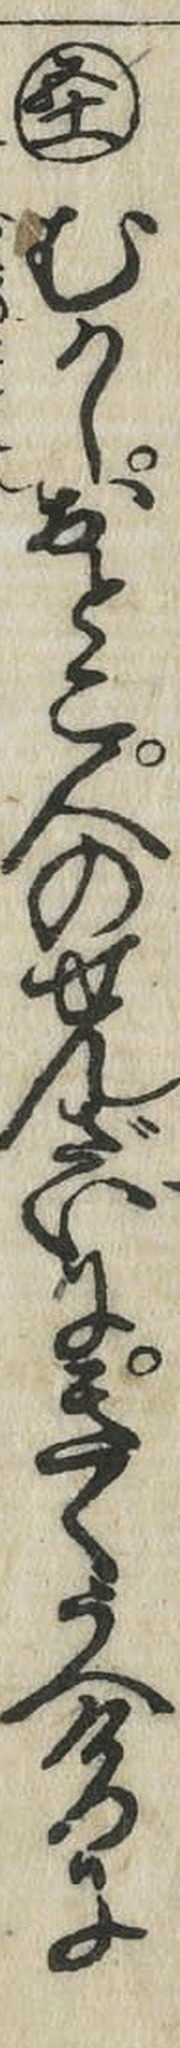(五十一)むかし。おとこ。人のせんざいに。きくうへけるに
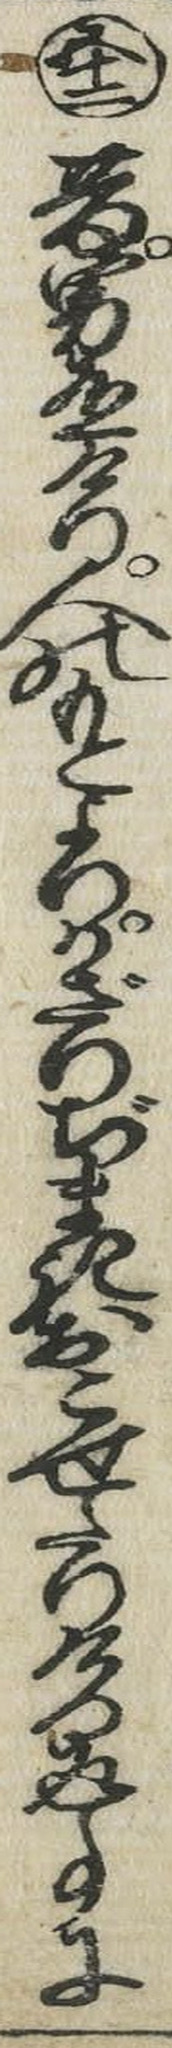(五十二)昔。男有けり。人のもとより。かざりぢまきおこせたりける返事に
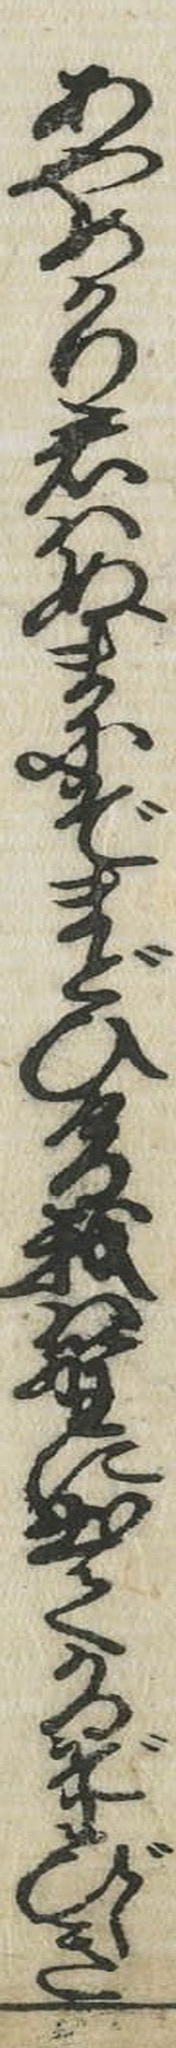あやめかり君はぬまにぞまどひける我は野に出てかるぞわびしき
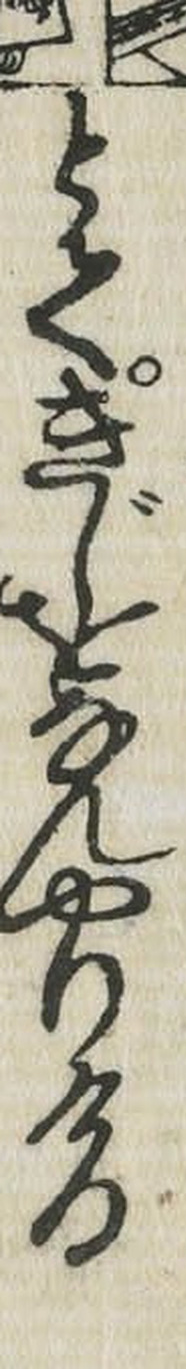とて。きじをなんやりける
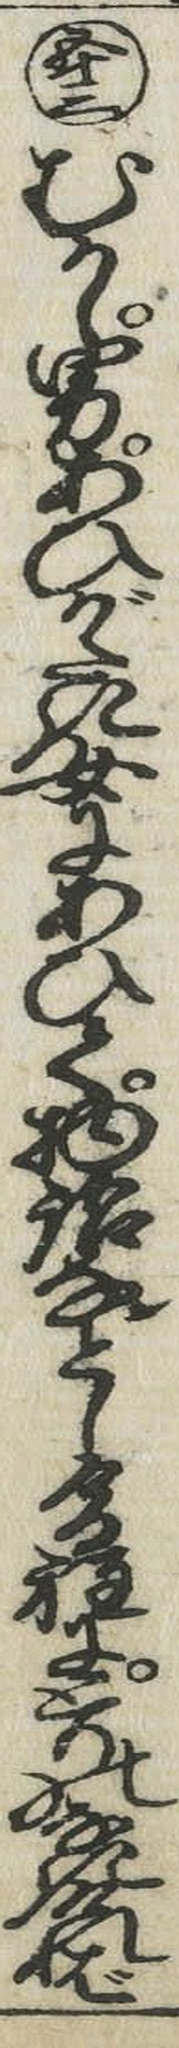(五十三)むかし。男。あひがたき女にあひて。物語などしける程に。とりのなきければ
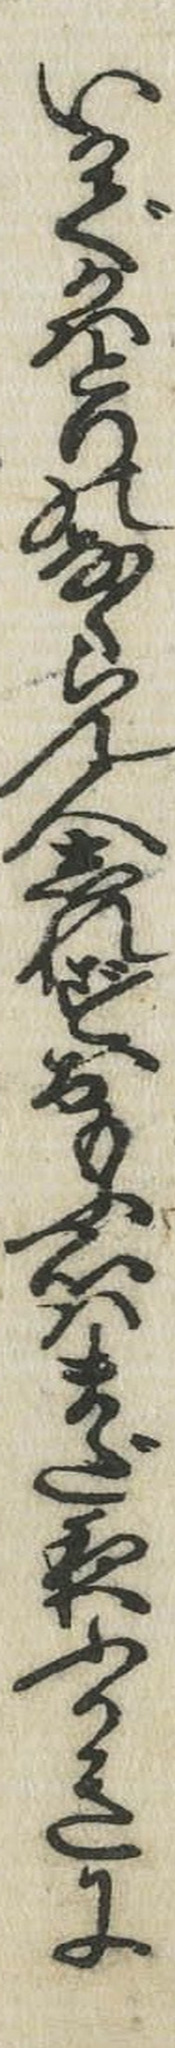いかでかはとりのなくらん人しれずおもふ心はまだ夜ふかきに
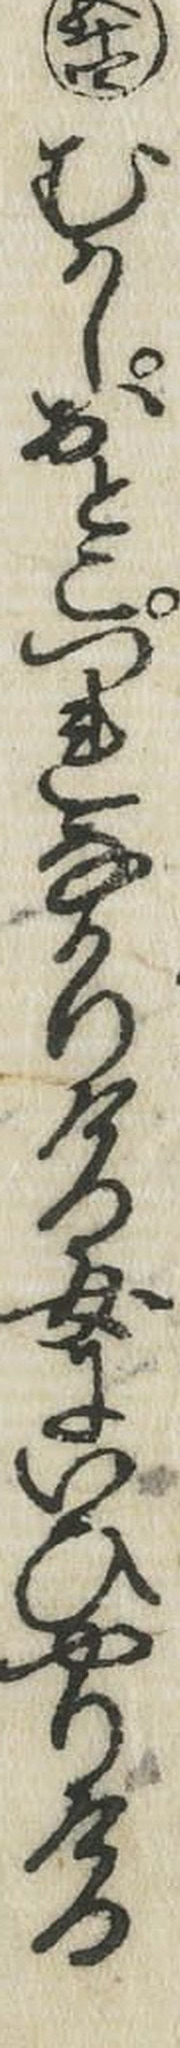(五十四)むかし。おとこ。つれなかりける女にいひやりける
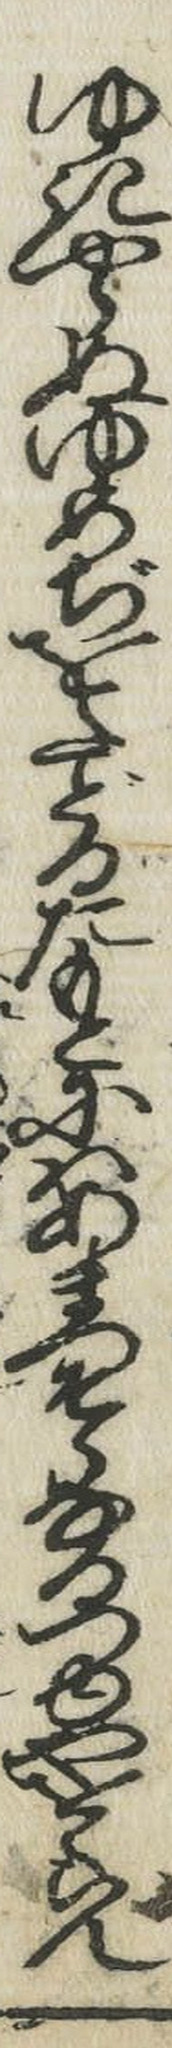ゆきやらぬゆめぢをたどるたもとにはあまつそらなるつゆやをくらん
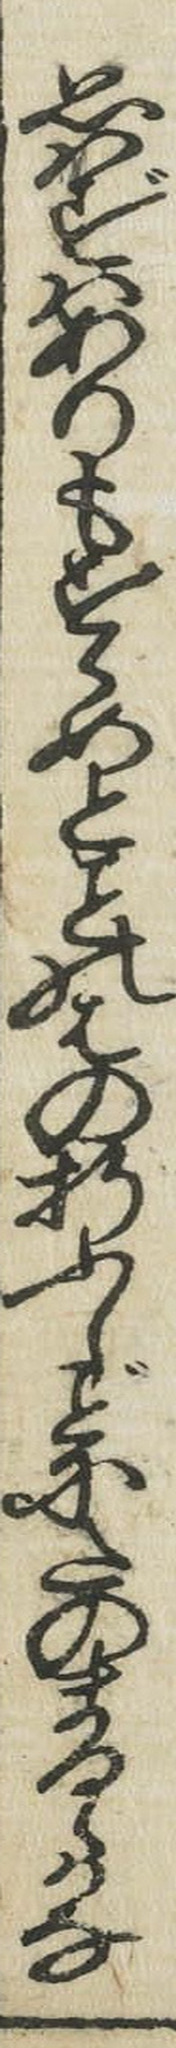思はずはありもすらめとことのはの折ふしごとにたのまるゝかな
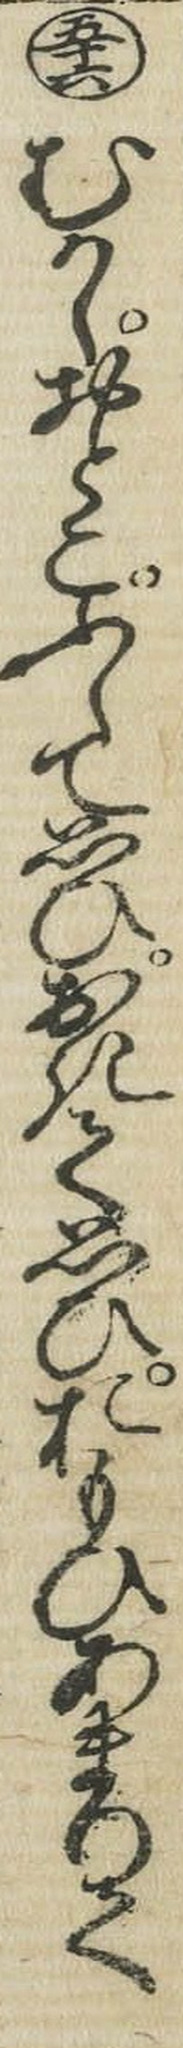(五十六)むかし。おとこ。ふして思ひ。おきて思ひ。おもひあまりて
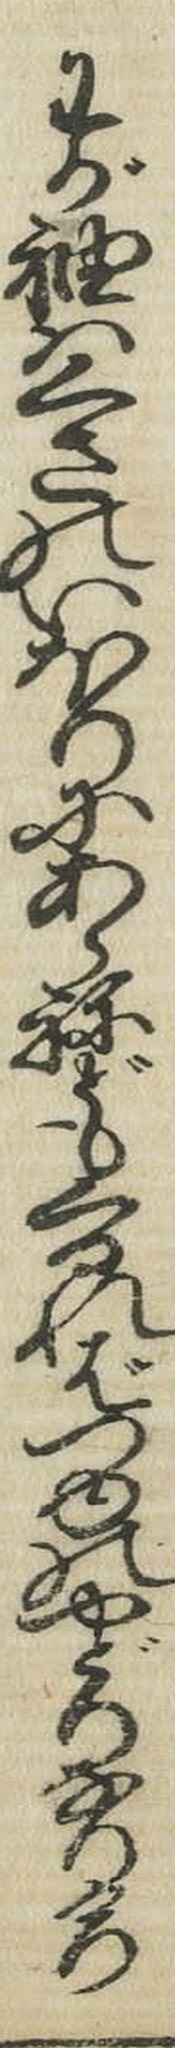わが袖はくさのいほりにあらねどもくるればつゆのやどりなりけり
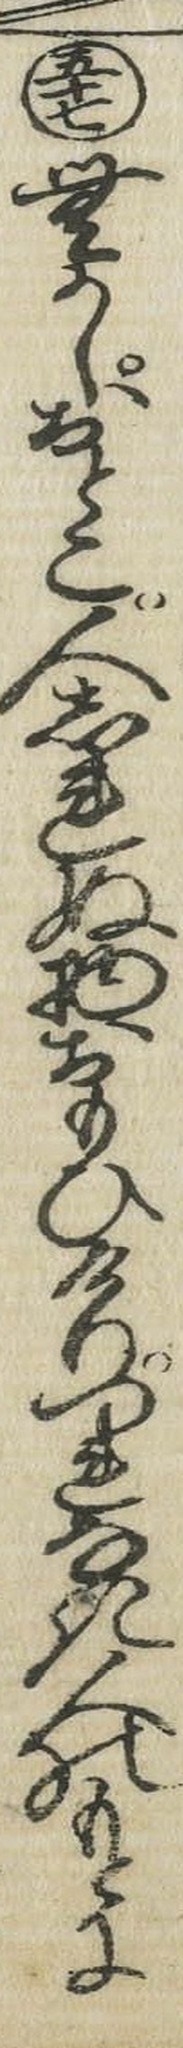(五十七)むかし。おとこ。人しれぬ物おもひけり。つれなき人のもとに
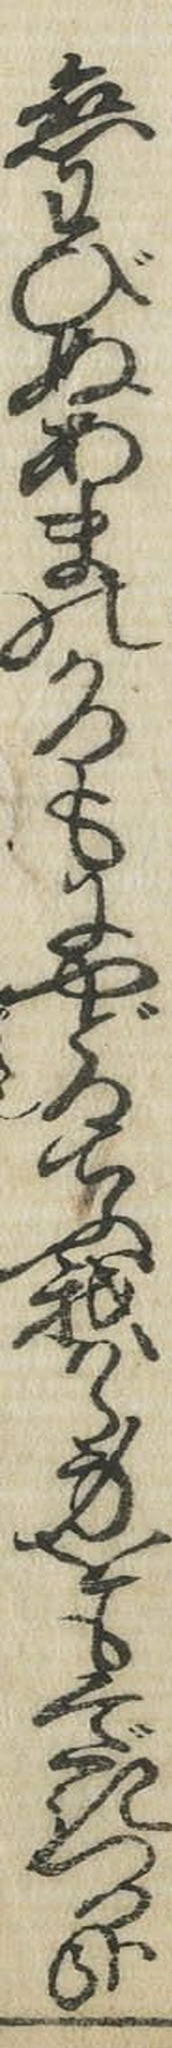恋わびぬあまのかるもにやどるてふ我から身をもくだきつる哉
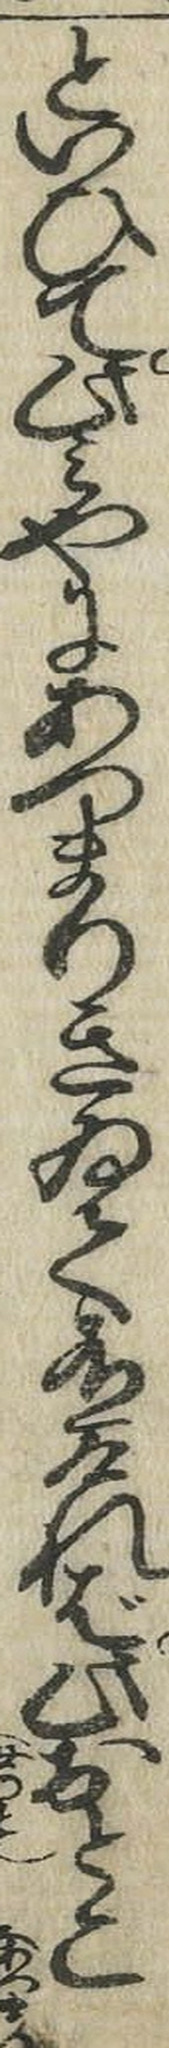といひて。此みやにあつまりきゐて有ければ。此おとこ
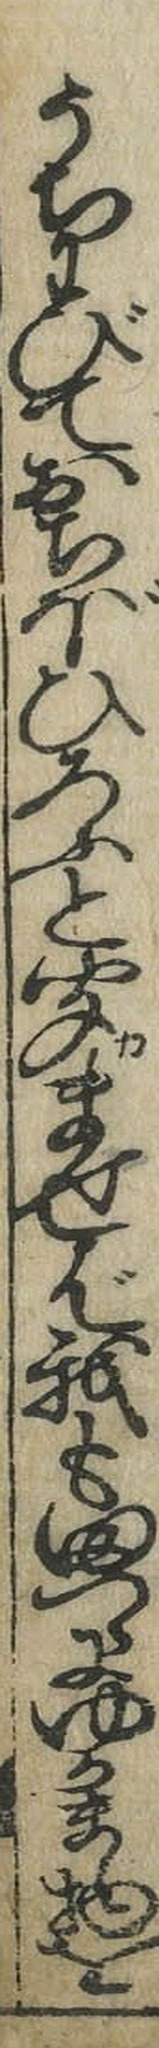うちわびておちぼひろふと聞ませば我も田づらにゆかまし物を

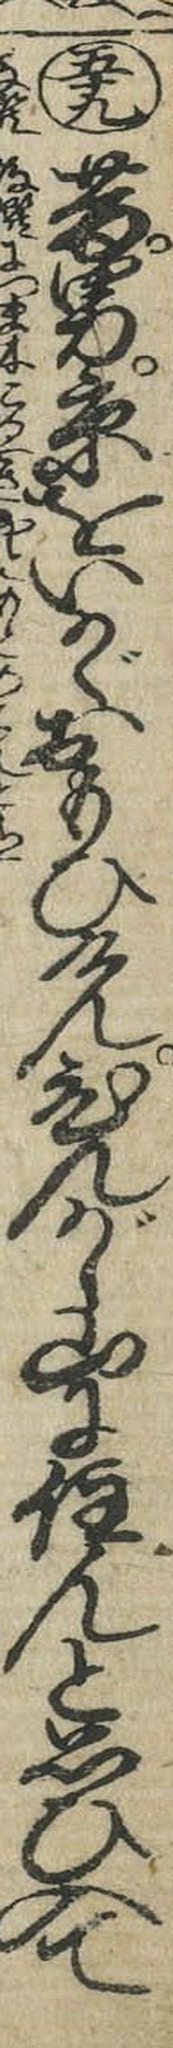(五十九)昔。男。京をいかゞおもひけん。ひんがし山に住んと思ひ入て
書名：新板絵入伊勢物語 : かうしやく付 2巻 下
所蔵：東京学芸大学教育コンテンツアーカイブ
